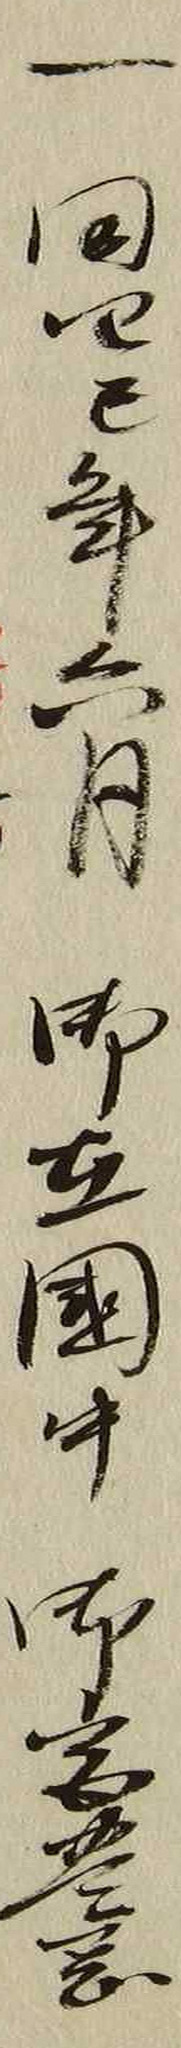一同四巳年六月御在国中御宮豊岡
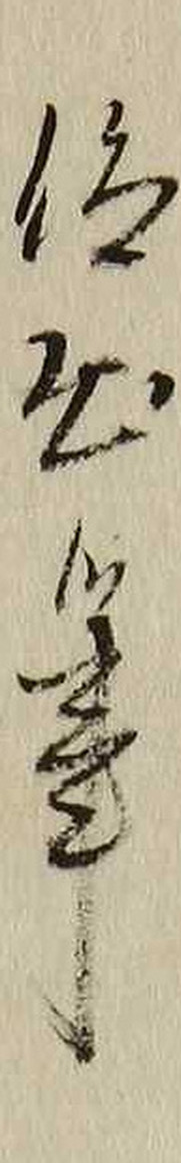仰出候事
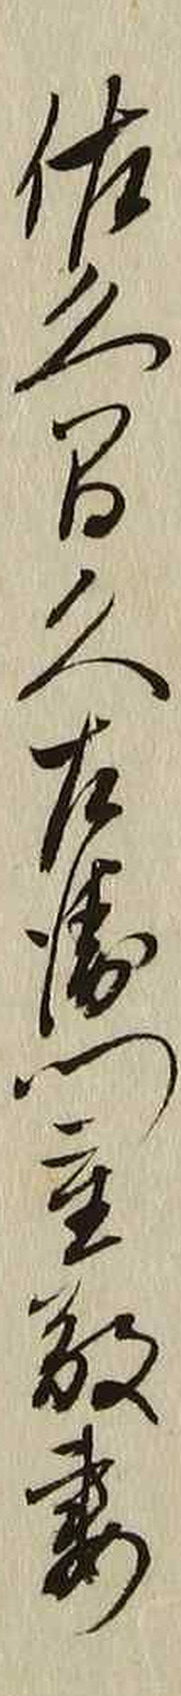女佐久間久左衛門重敬妻
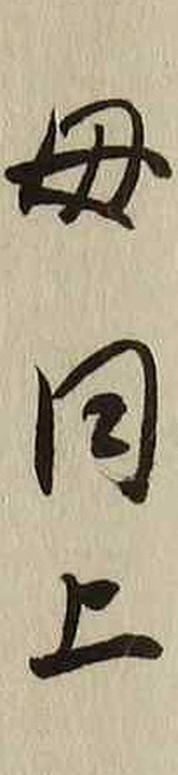母同上
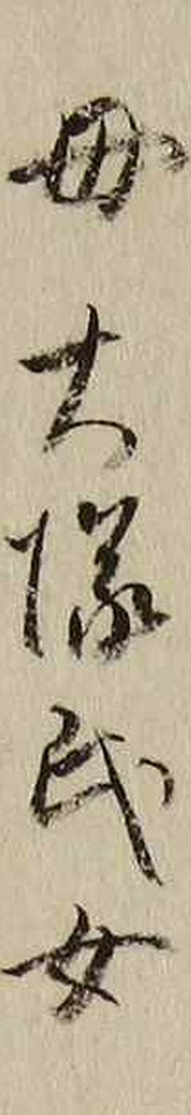母大塚氏女
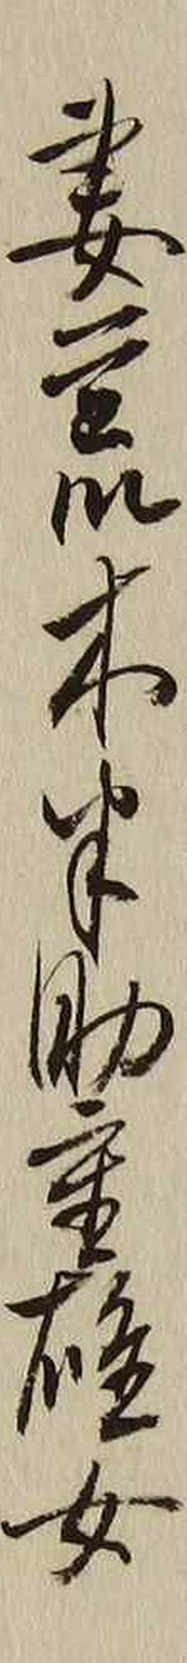妻荒木半助重碓女
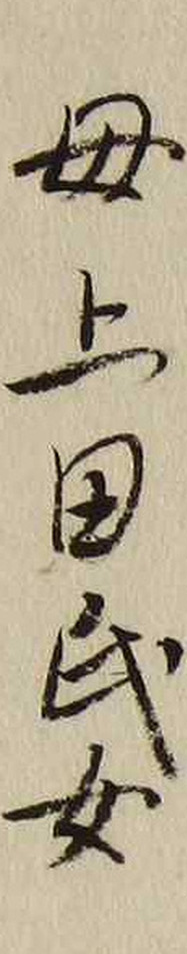母上田氏女

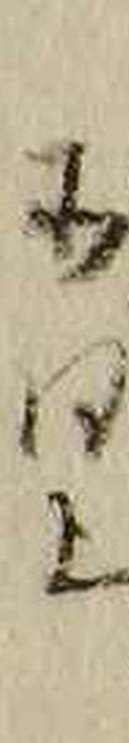母同上
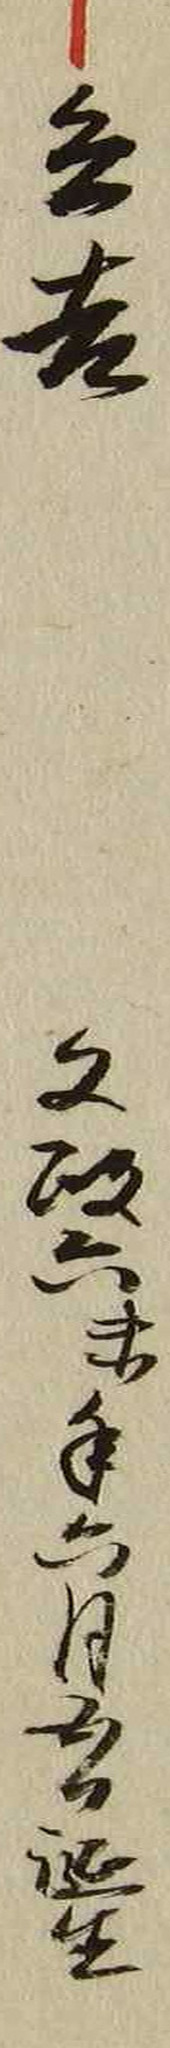兵吉文政六未年六月五日誕生
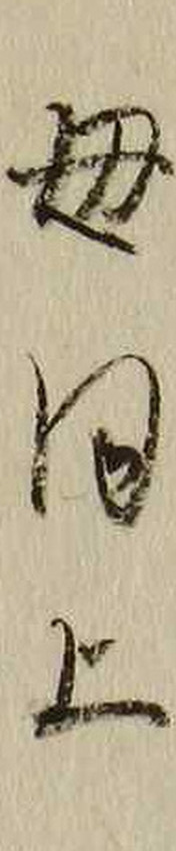母同上

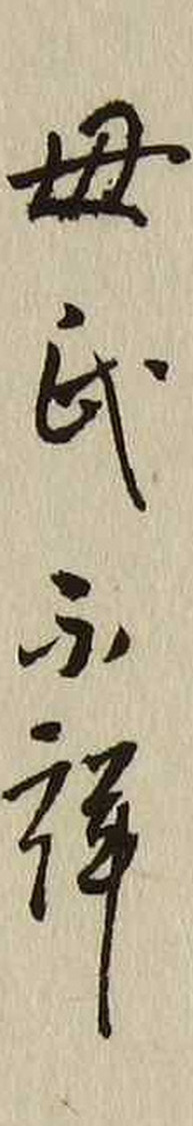母氏不詳
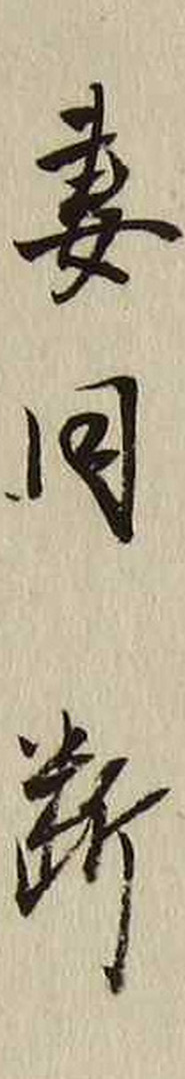妻同断
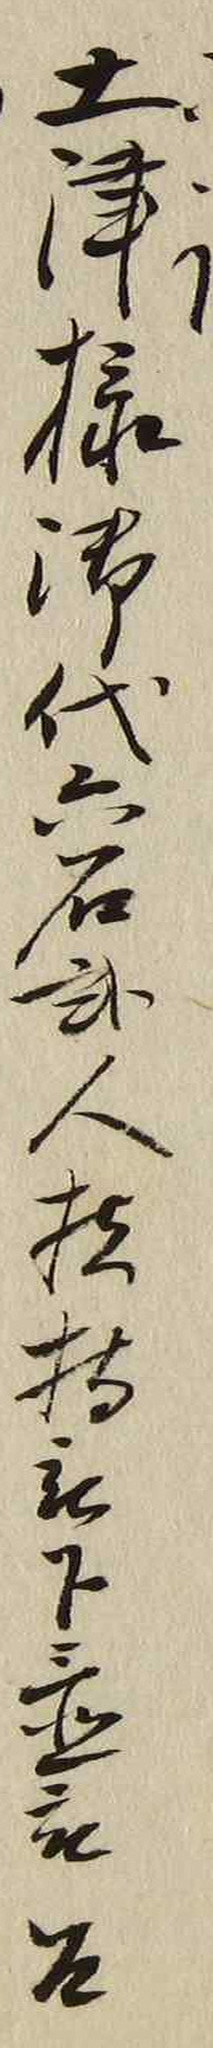土津様御代六石弐人扶持被下置被召
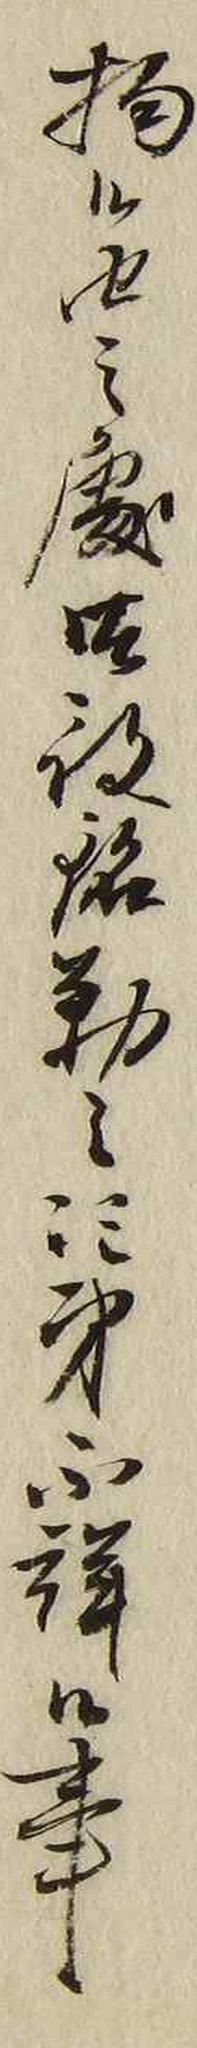抱候由之処御役銘勤之次第不詳候事

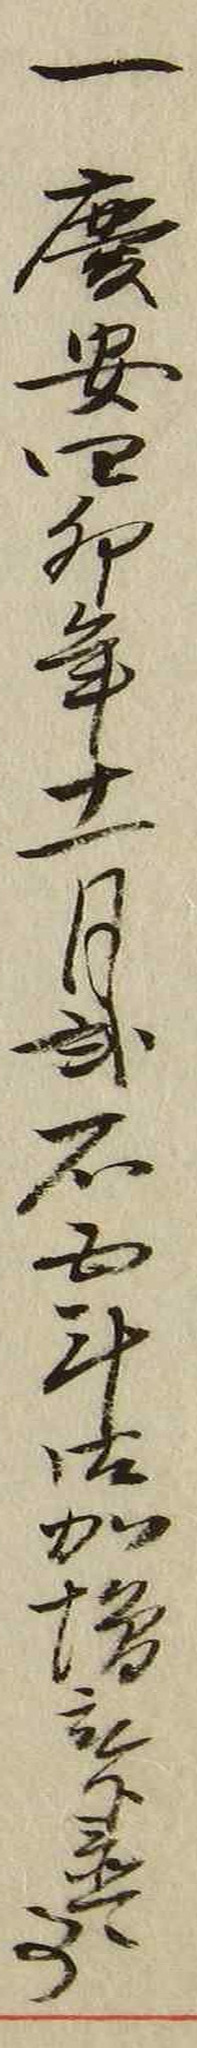一慶安四卯年十一月弐石五斗御加増被下置候事
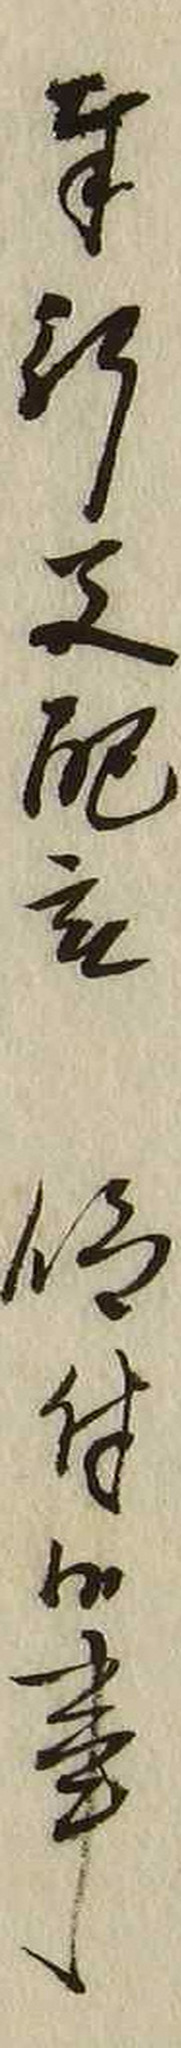奉行支配被仰付候事
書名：諸士系譜　巻之350　せ之部1冊全
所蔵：会津若松市立会津図書館
